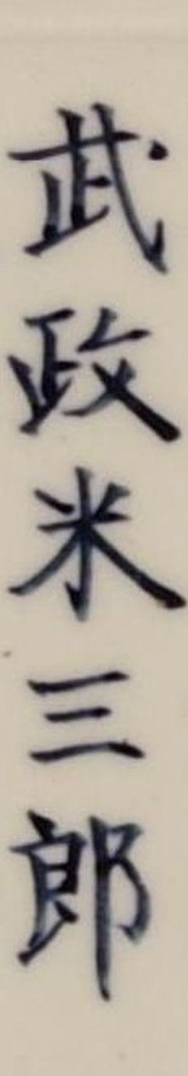武政米三郎
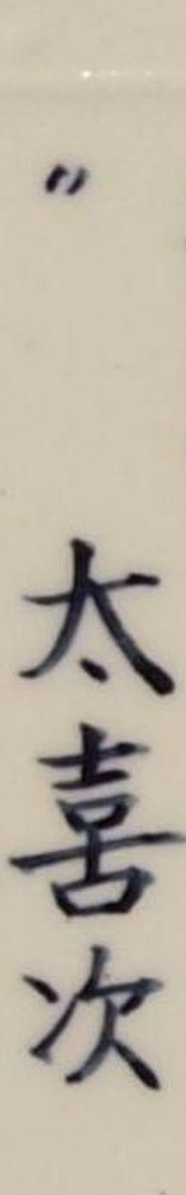太喜次
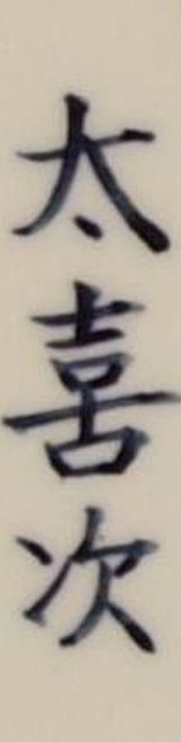太喜次
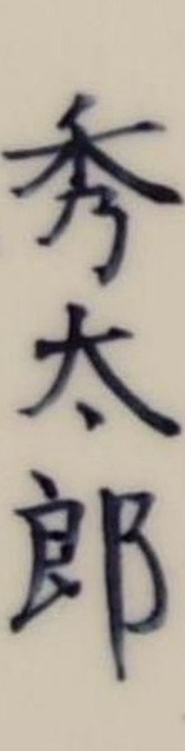秀太郎
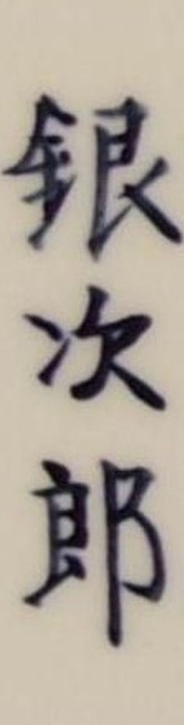銀次郎

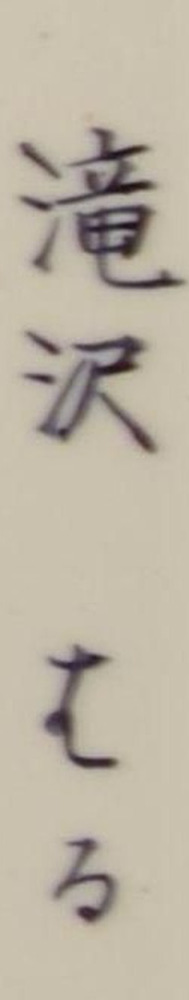滝沢はる
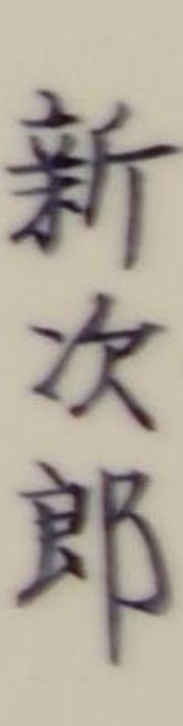新次郎
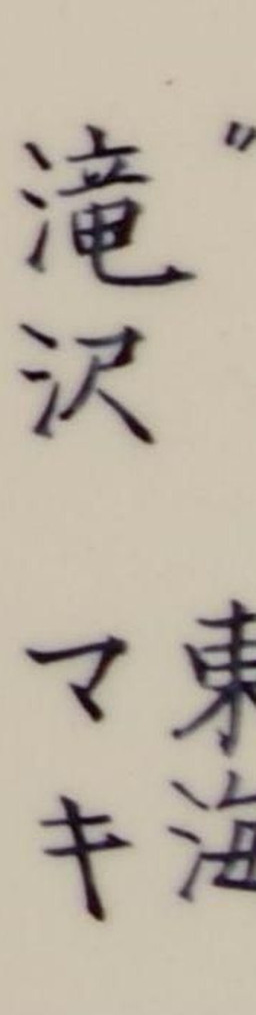滝沢マキ
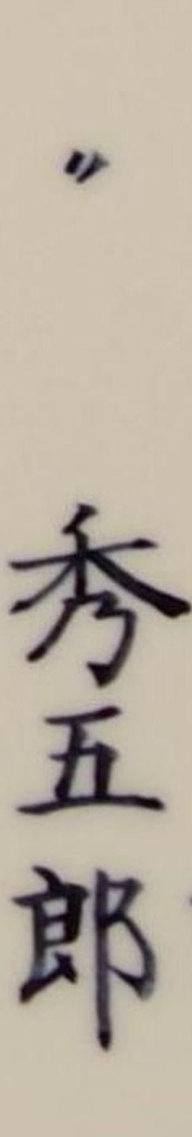秀五郎
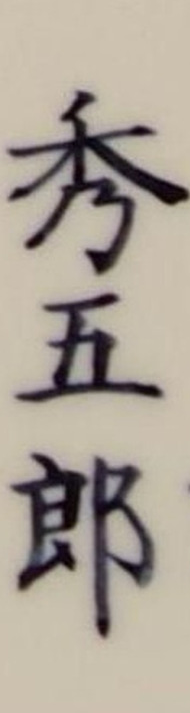秀五郎
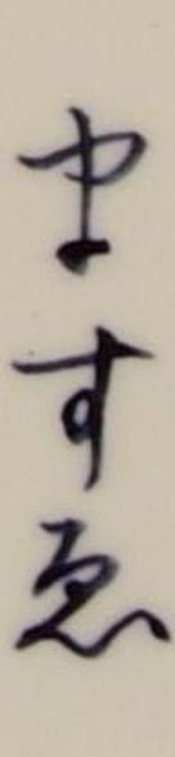ますえ
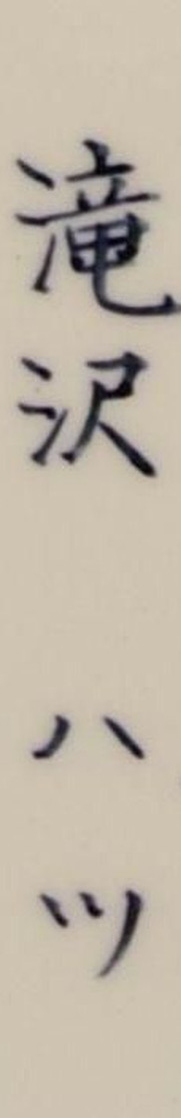滝沢ハツ
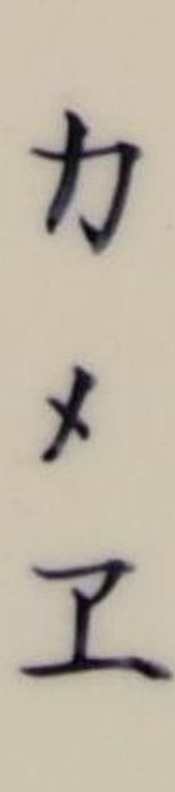カメエ
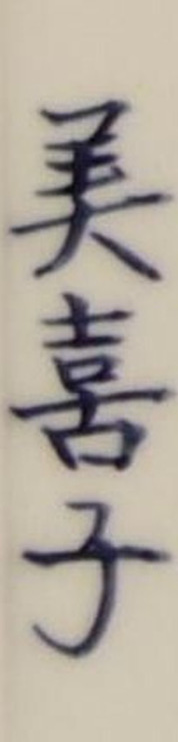美喜子

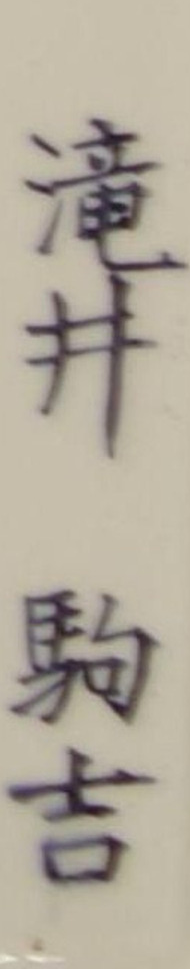滝井駒吉
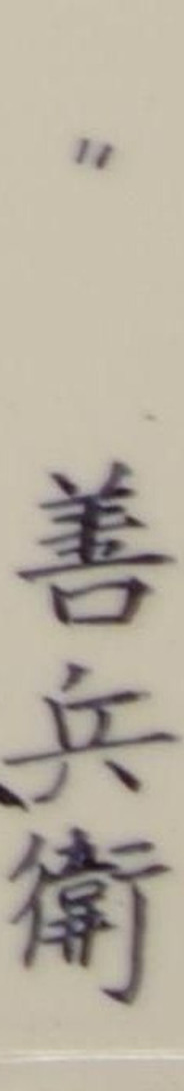善兵衛
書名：E~L
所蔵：高野山金剛峯寺
